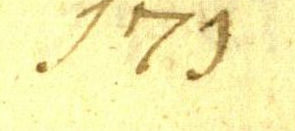171
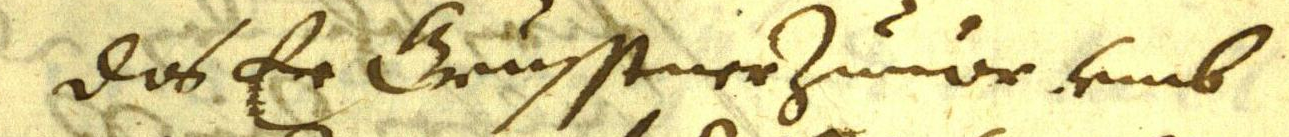das Er Grūsstner Zūūor vmb
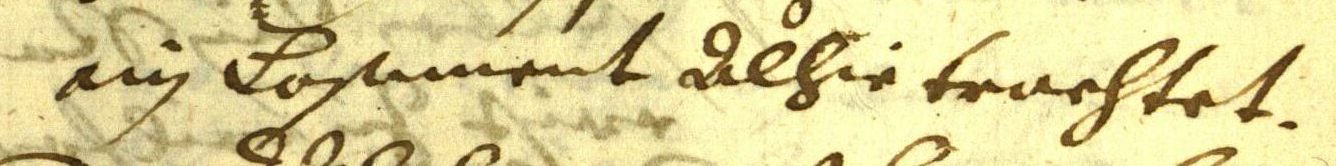ain Losament Alhie trachtet.
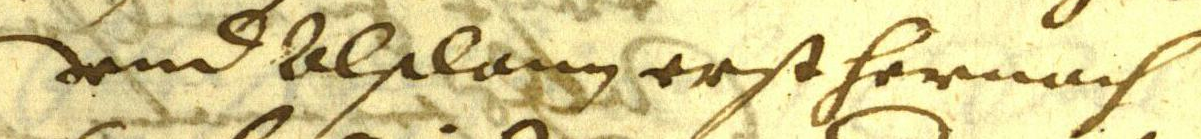Vnd Alsdann erst hernach
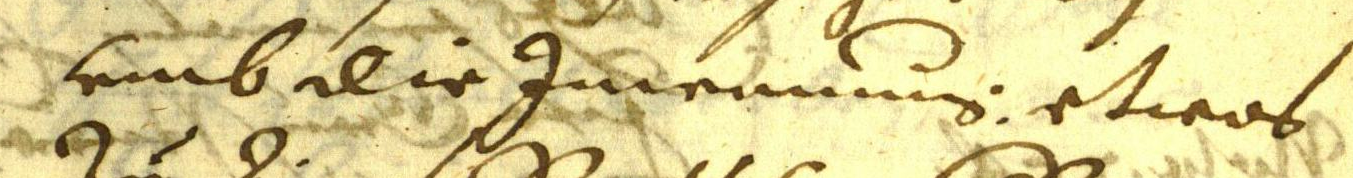vmb die Inwonūng: etwas
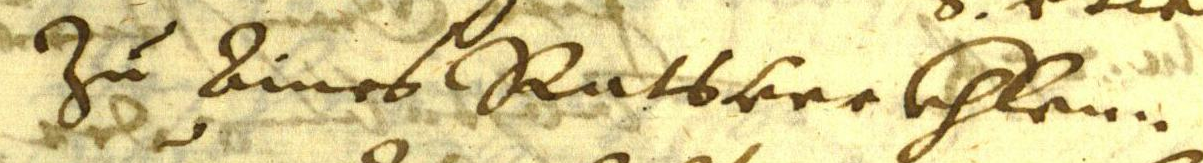Zū Aines Ratsverkhlein¬
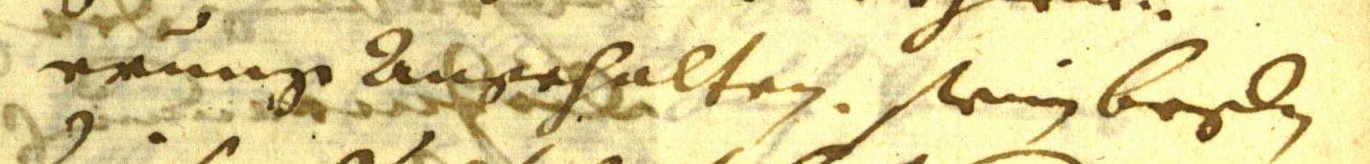erūng Angehalten. seim begdn
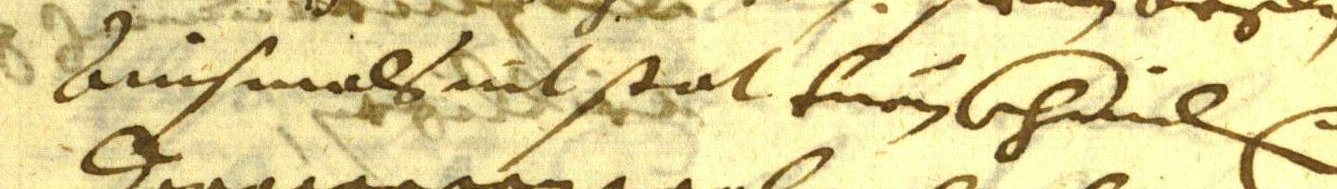Ainsmals nit stat tūen khind etc
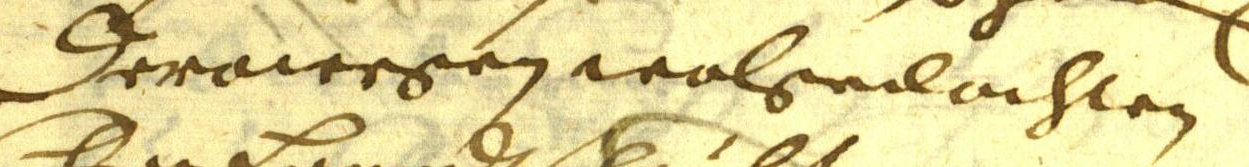Derowegen wolgedachten
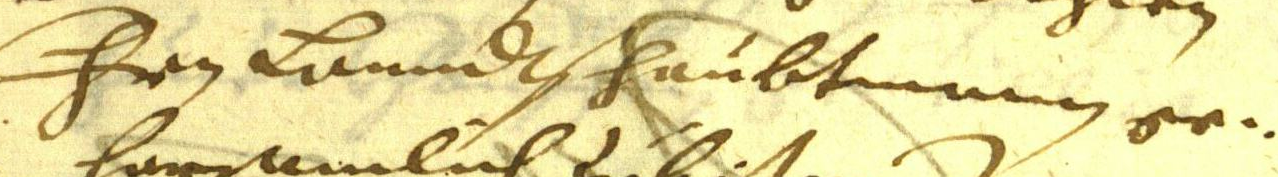hrn Lanndtshaūbtmann ge¬
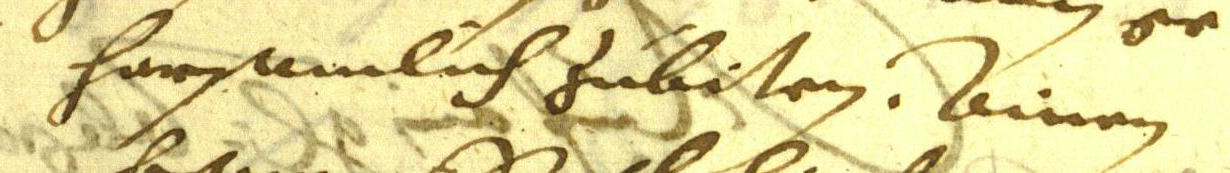horsamlich Zūbiten. Ainen
